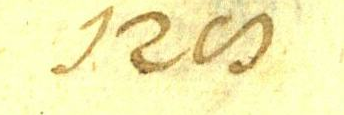128
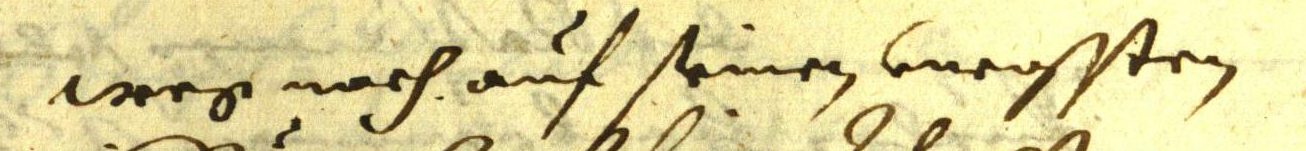weg noch aūf seinen vncossten
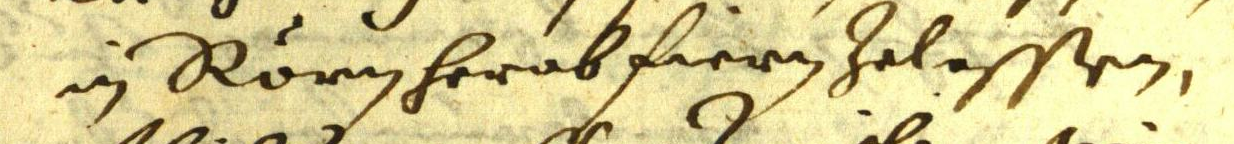in Rōrn herab fiern Zelassen,
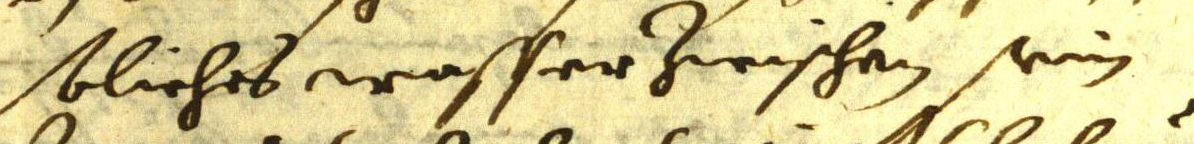soliches wasser Zwischen sein
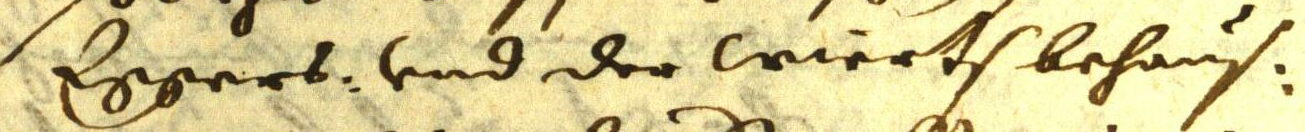Eggers: vnd der wiertsbehaūs¬
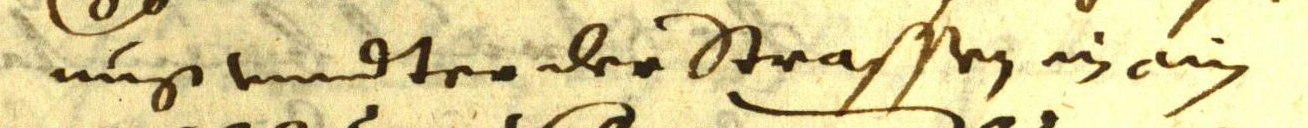ūng vnndter der Strassen in ain
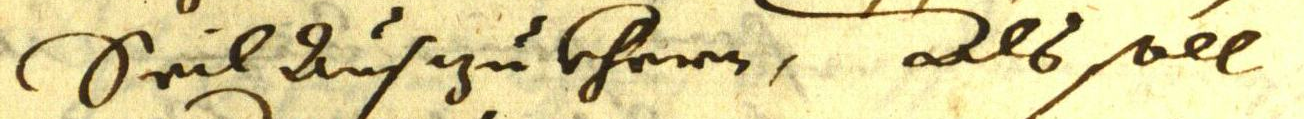Seil Aūszūkhern, Als soll
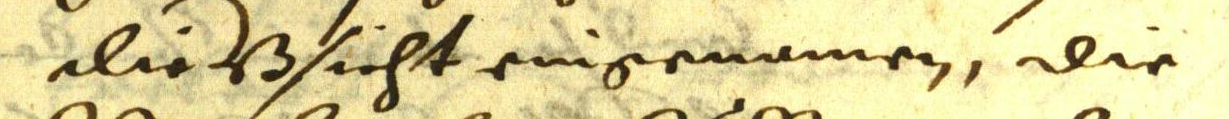die Bsicht eingenomen, die
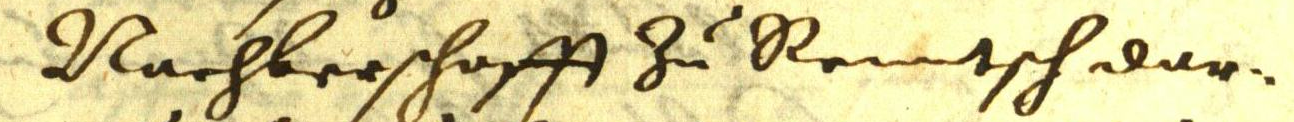Nachberschafft Zū Renntsch dar¬
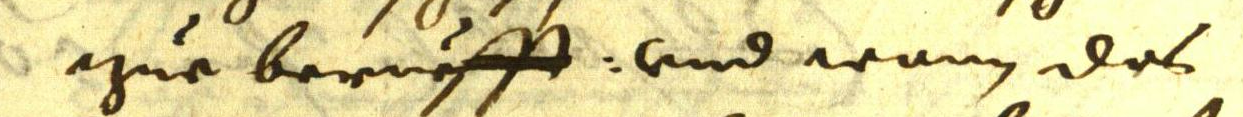zūe berūefft: vnd wann das
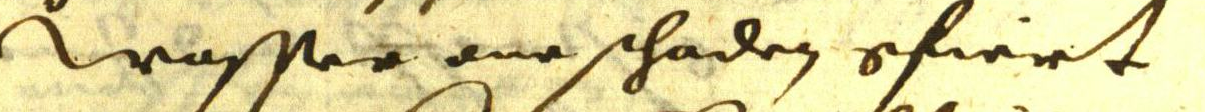Wasser one schaden gfiert
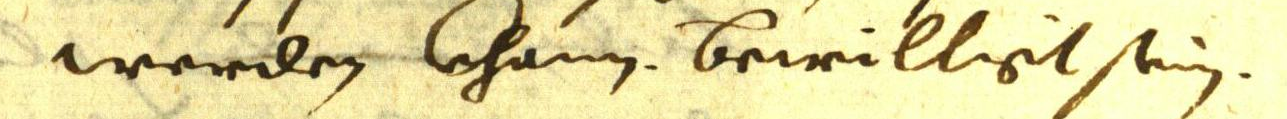werden khann. bewilligt sein.
